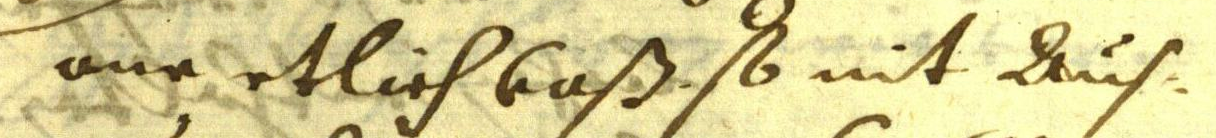one etlich vaß. so nit Aūs¬
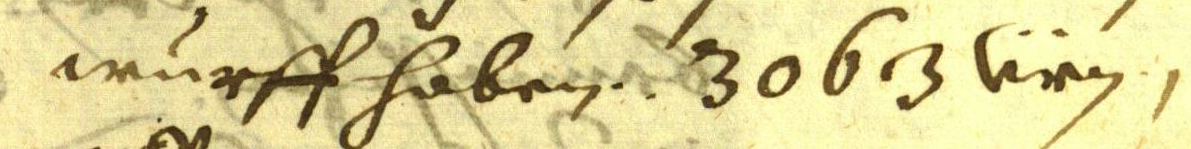wūrff haben: 3063 v̈rn,
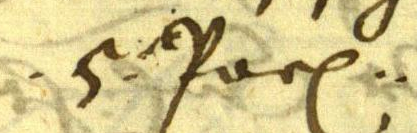.5. Pac:
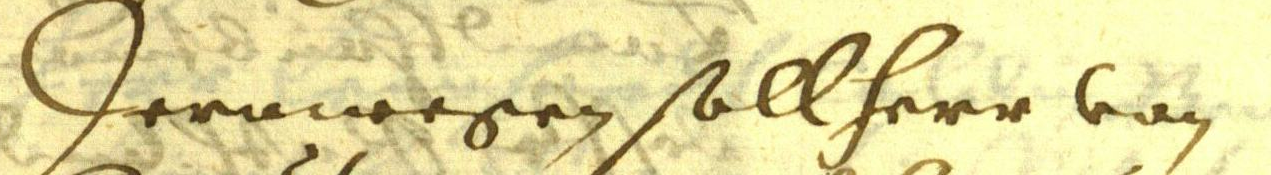Derowegen soll herr von
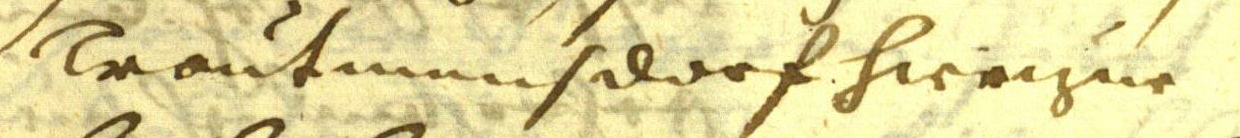Traūtmansdorf hierzūe
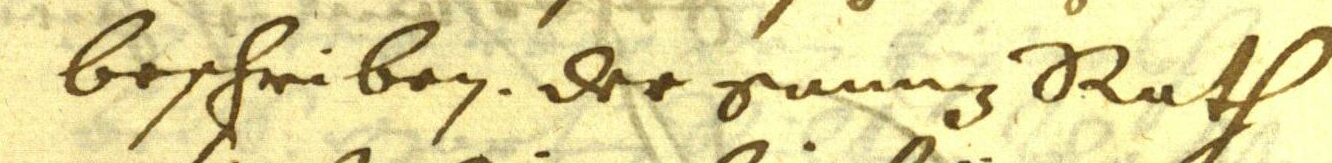beschriben. der gannz Rath
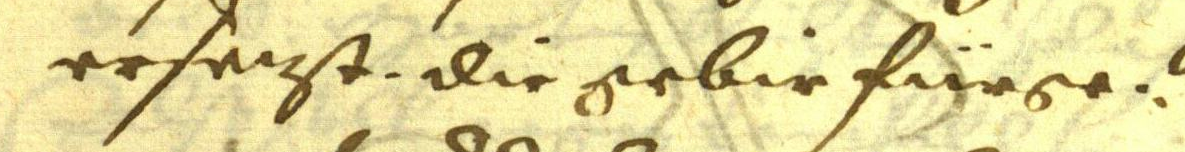ersezt. die gebir fürge¬
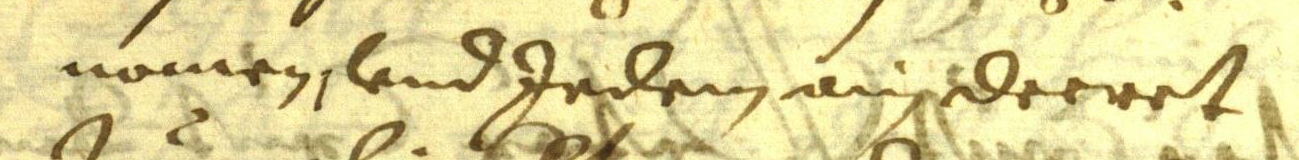nomen, vnd Jedem ain decret
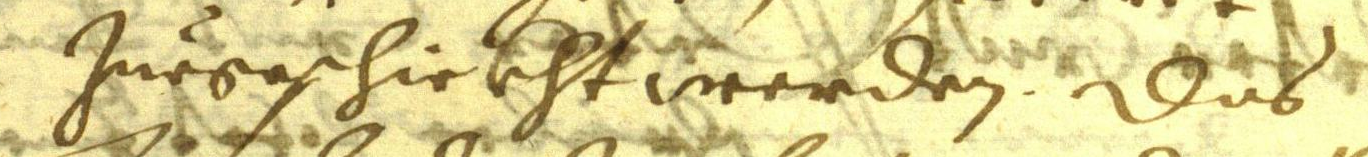Zūegeschickht werden. das
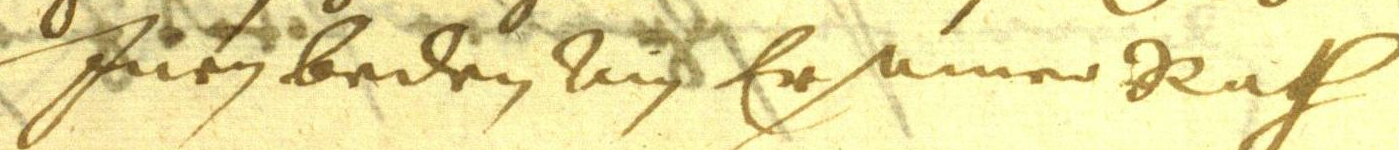Inen beden Ain Ersamer Rath
